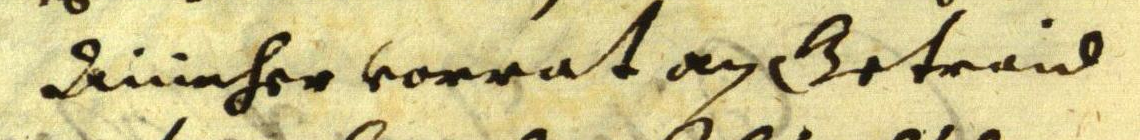Ainicher vorrat an Getraid
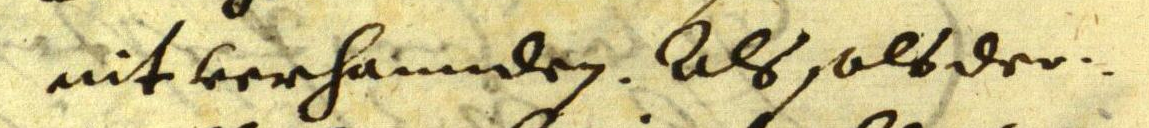nit verhannden. Als sols der¬
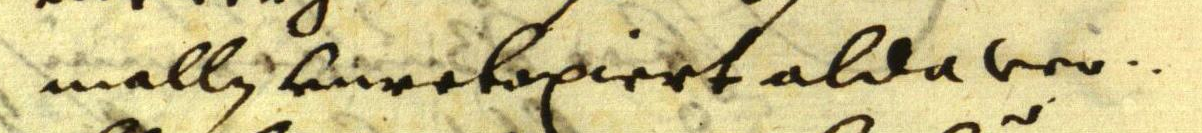malln vnretaxiert alda ver¬
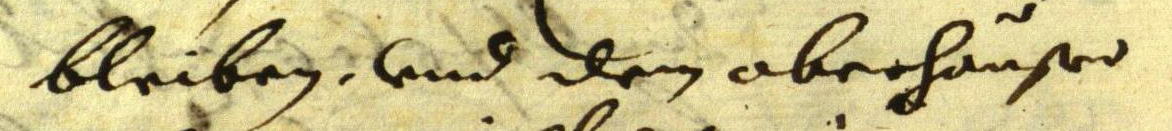bleiben. vnd dem oberhaūser
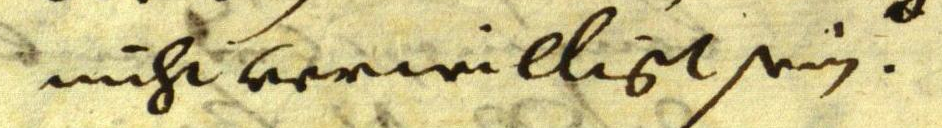nicht verwilligt sein.
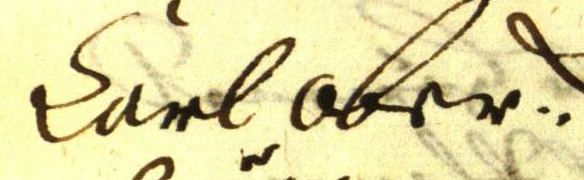Carl Ober¬
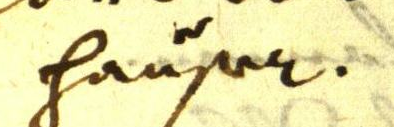haūser.
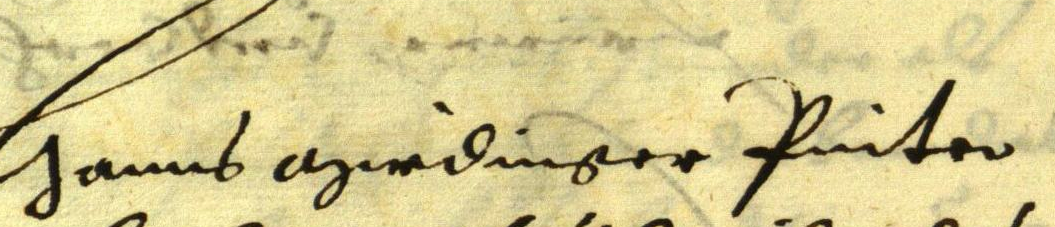Hanns Mirdinger Pinter
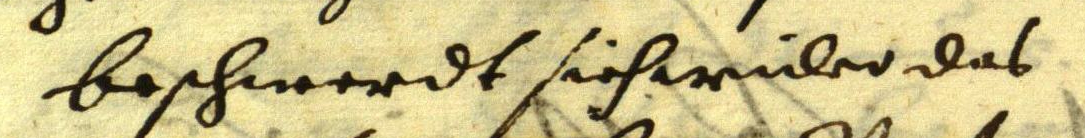beschwerdt sich wider das
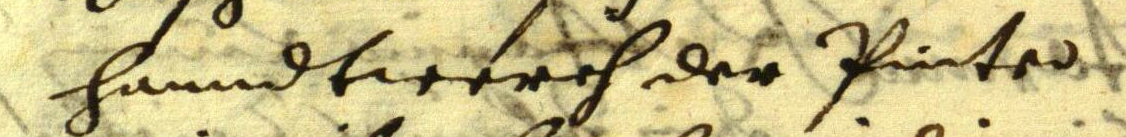hanndtwerch der Pinter
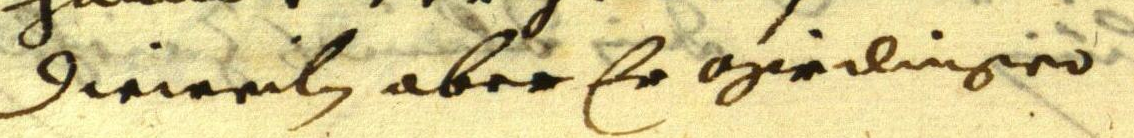dieweiln aber Er Mirdinger
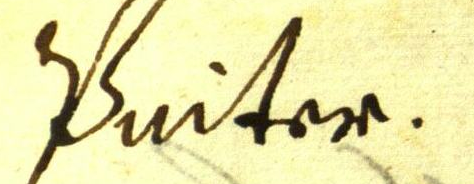Pinter.
